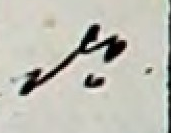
Do
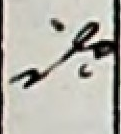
Do
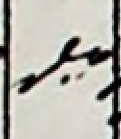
Do
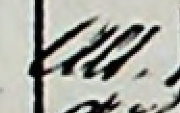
Alt.
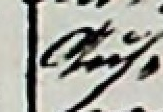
Auf„
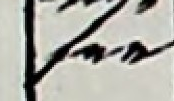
see
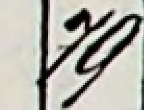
79
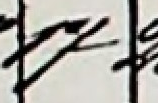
17
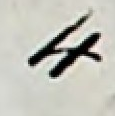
4
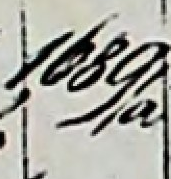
1689/a
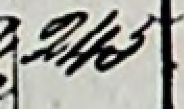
245
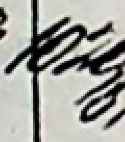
1020/6
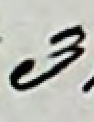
3
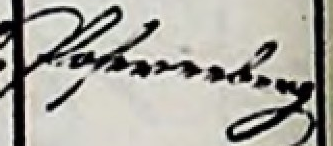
P???berg
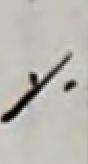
./.
